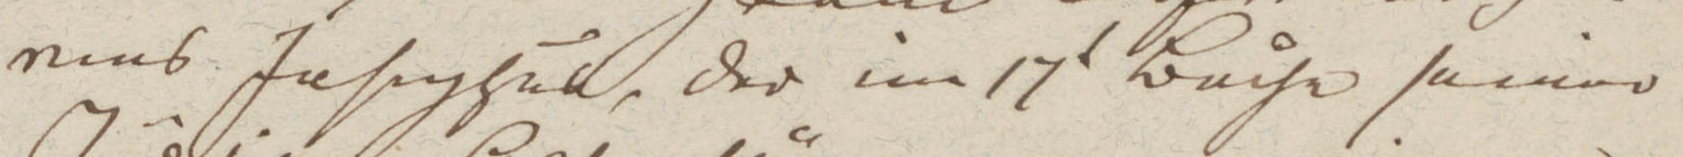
vius Josephus, der im 17t Buche seiner
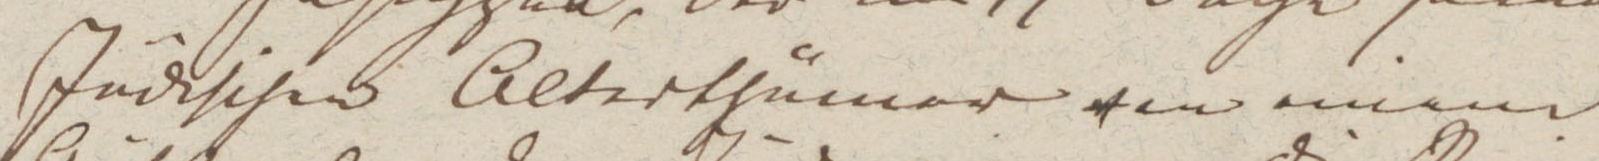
Jüdischen Alterthümer von einem
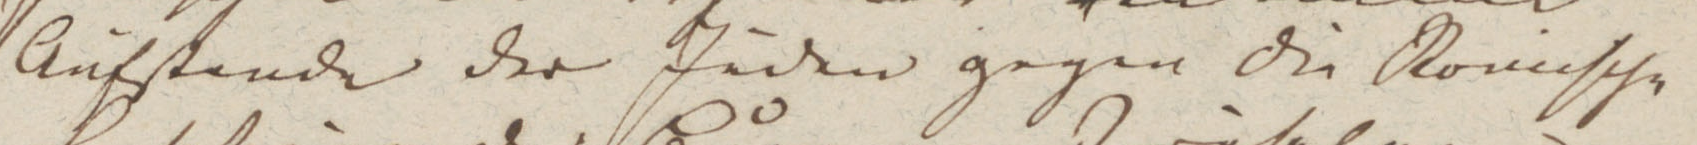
Aufstande der Juden gegen die Römische
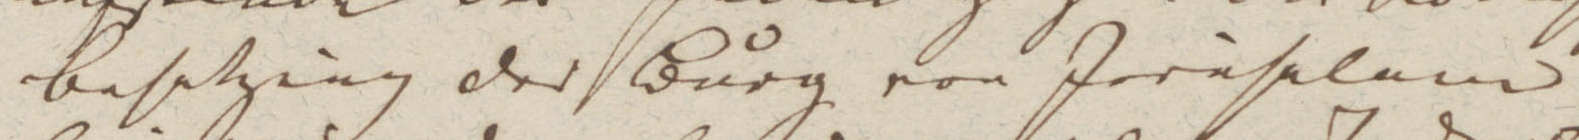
Besatzung der Burg von Jerusalem
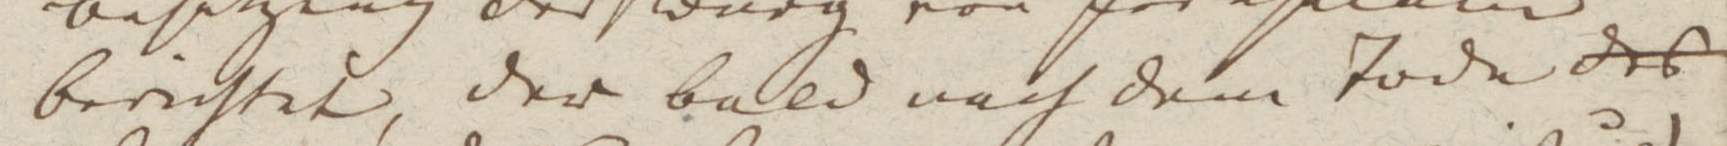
berichtet, der bald nach dem Tode des
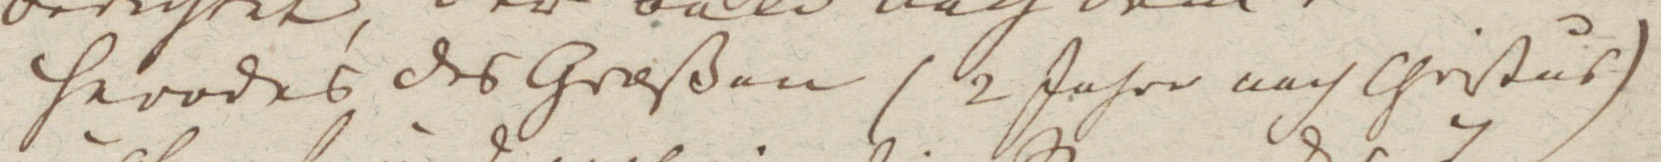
Herodes des Grossen (2 Jahre nach Christus)
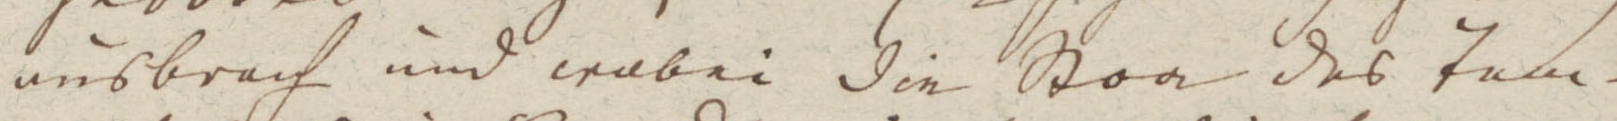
ausbrach und wobei die Stoa des Tem-
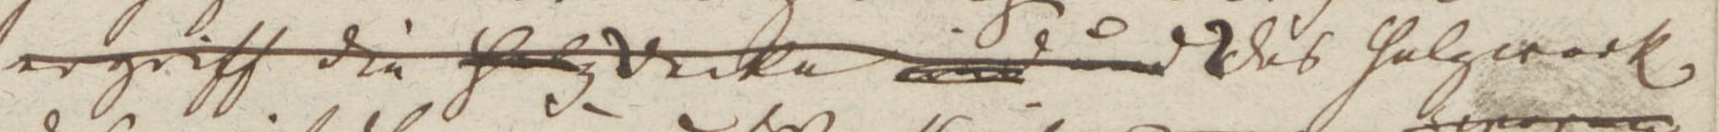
ergriff die HolzdDecke und dDas Holzwerk
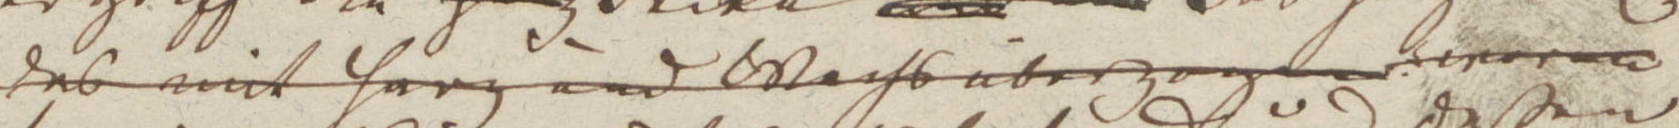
das mit Harz und Wachs überzogen woran
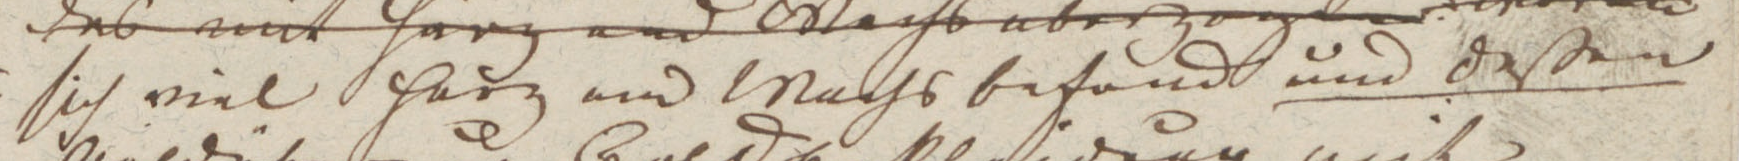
% sich viel Harz und Wachs befand und dessen
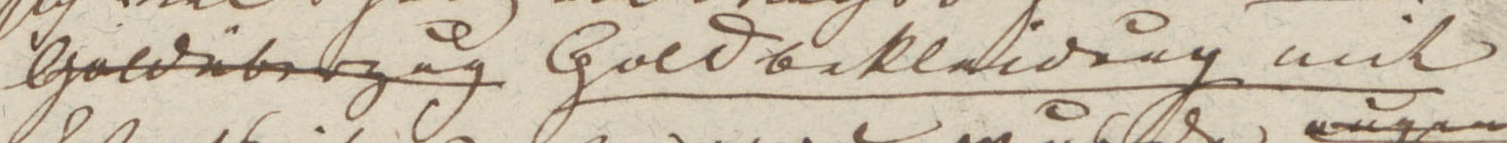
Goldüberzug Goldbekleidung mit
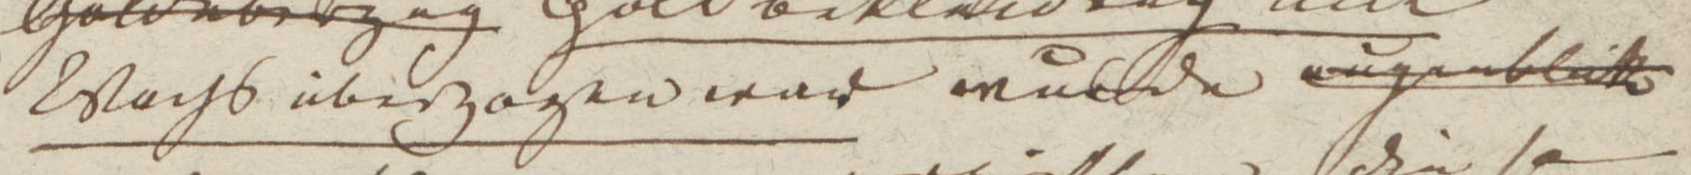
Wachs überzogen war wurde augenblick
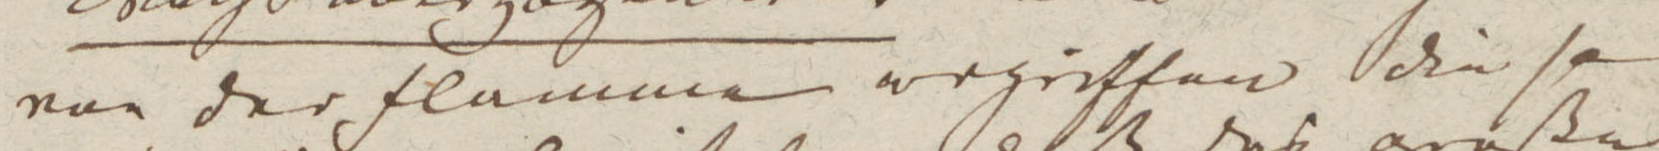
von der Flamme ergriffen die so
